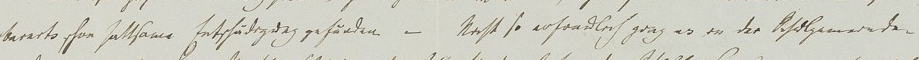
bereits schon sattsam e Entschädigung gefunden. – Nicht so erfreulich ging es in der Schulgemeinde-
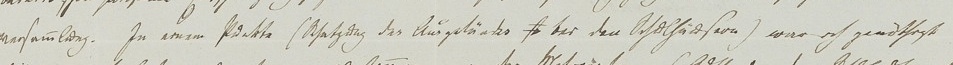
versammlung. In einem Punkte (Schatzung des Ausgeländes bei den Schulhäusern) war ich genöthigt
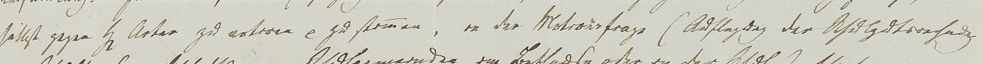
selbst gegen Herrn Arter zu votiren & zu stimmen, in der Motionsfrage (Auslegung der Schulgutsrechnung
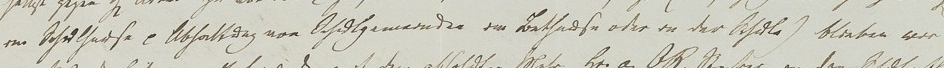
im Schulhause & Abhaltung von Schulgemeinden im Bethause oder in der Schule) blieben wir
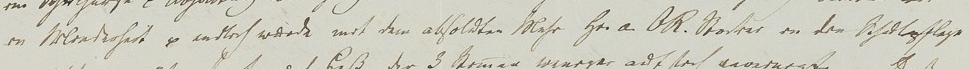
in Minderheit & endlich wurde mit dem absoluten Mehr Hr. a. OR. Stocker in die Schulpflege
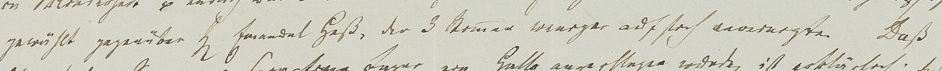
gewählt gegenüber Herrn Emauel Heß, der 3 Stimmen weniger auf sich vereinigte. Daß
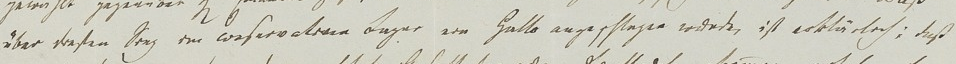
über diesen Sieg im conservativen Lager ein Hallo angeschlagen wurde, ist erklärlich; daß
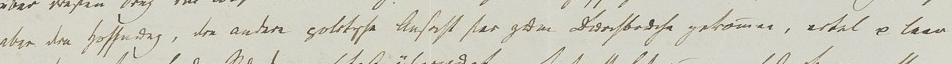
aber die Hoffnung, die andere politische Ansicht sei zum Durchbruche gekommen, eitel & leer
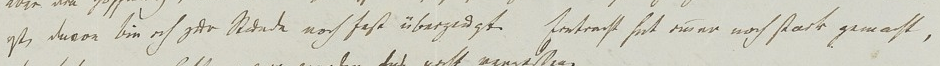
ist, davon bin ich zur Stunde noch fest überzeugt. Eintracht hat immer noch stark gemacht,
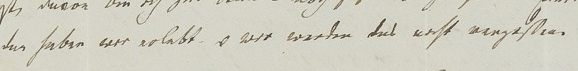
das haben wir erlebt & wir werden das nicht vergessen.
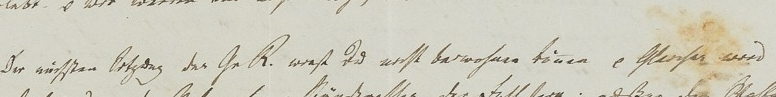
Der nächsten Sitzung des GrR. wirst Du nicht beiwohnen können & Gleiches wird
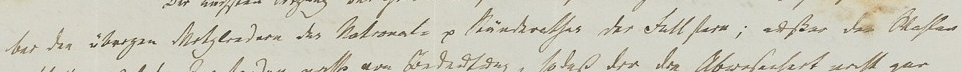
bei den übrigen Mitgliedern des National- & Ständerathes der Fall sein; außer den Wahlen
